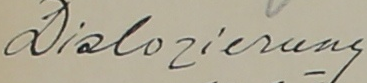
Dislozierung
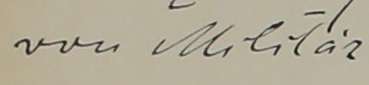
von Militär
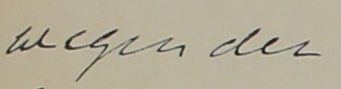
wegen der
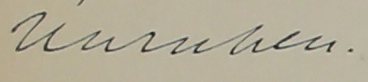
Unruhen
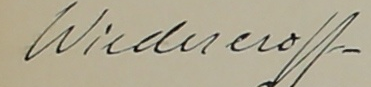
Widereröff-
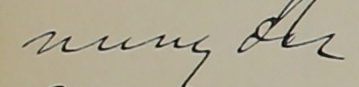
nung der
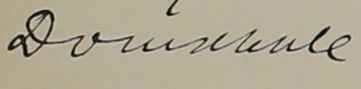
Domschule
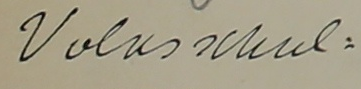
Volksschul
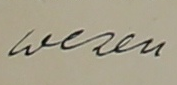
wesen
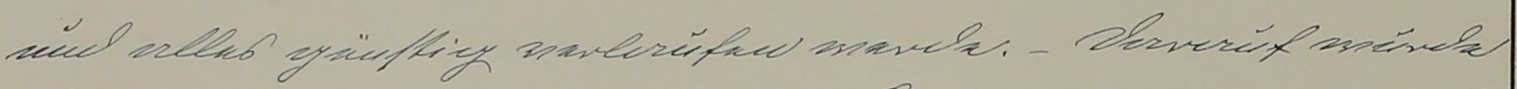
und alles günstig verlaufen werde. – Darauf wurde
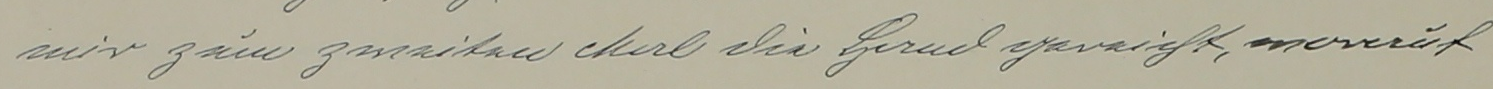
mir zum zweiten Mal die Hand gereicht, worauf
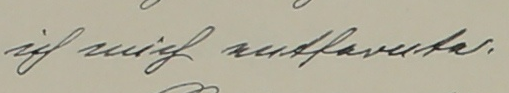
ich mich entfernte.
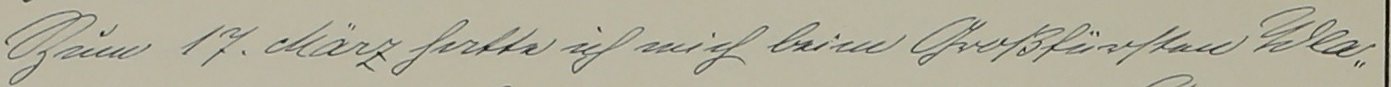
Zum 17. März hatte ich mich beim Großfürsten Wla-
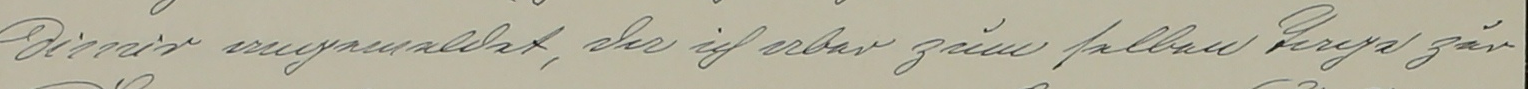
dimir angemeldet, da ich aber zum selben Tage zur
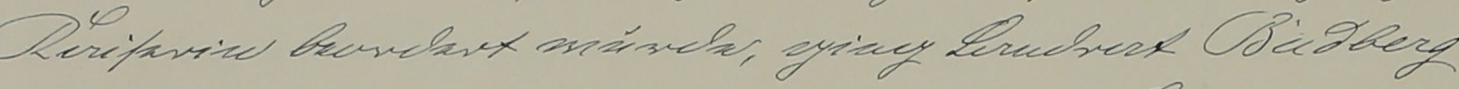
Kaiserin beordert wurde, ging Landrat Budberg
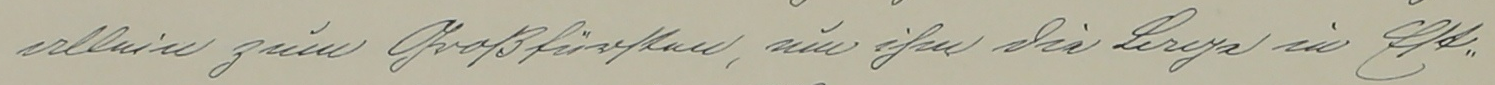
allein zum Großfürsten, um ihm die Lage in Est-
